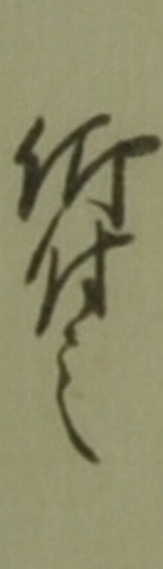仰付之
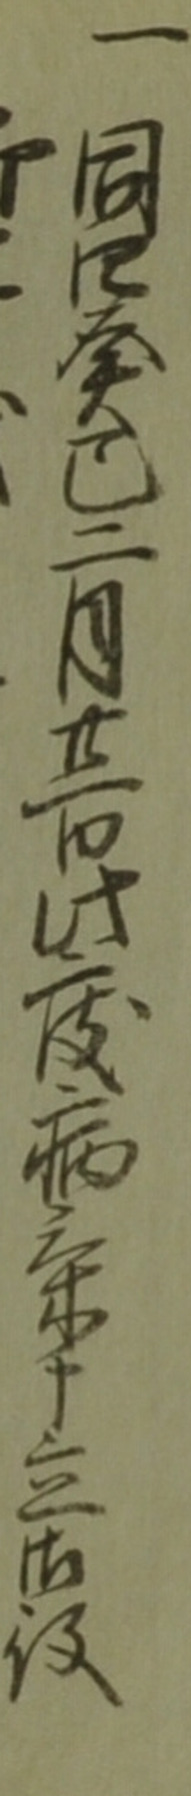一同四癸巳二月廿一日此度病気申立御役
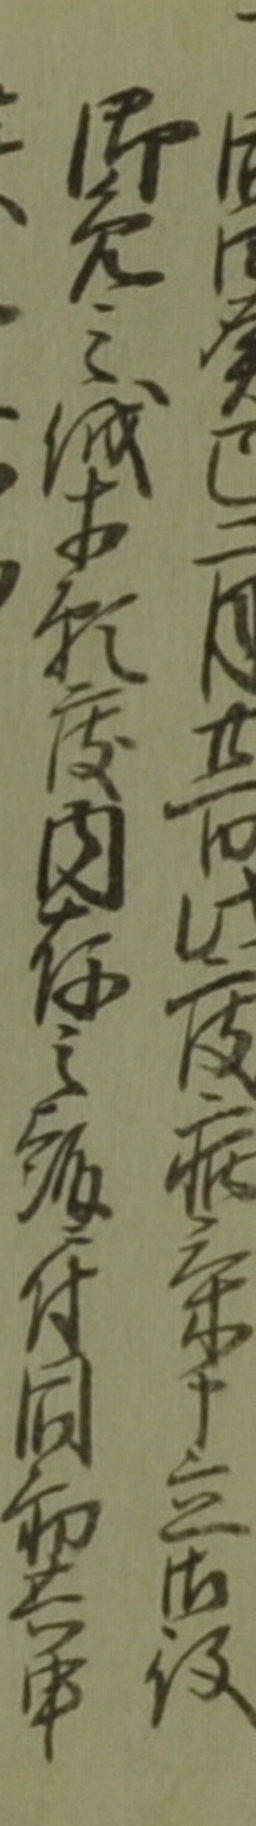御免之儀相願度内存之趣ニ付同勤共申
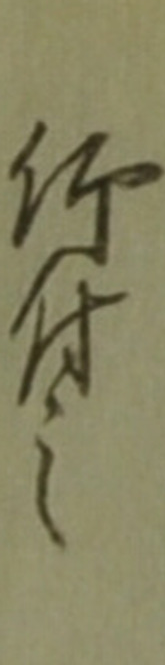仰付之
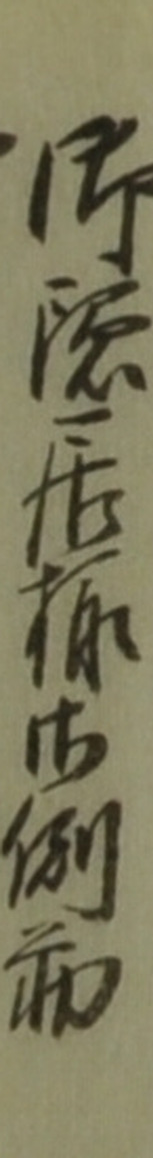御隠居様御側勤
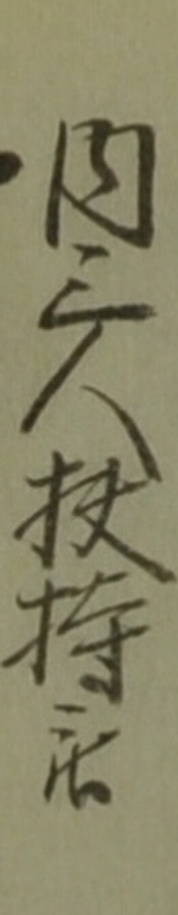内三人扶持被召上
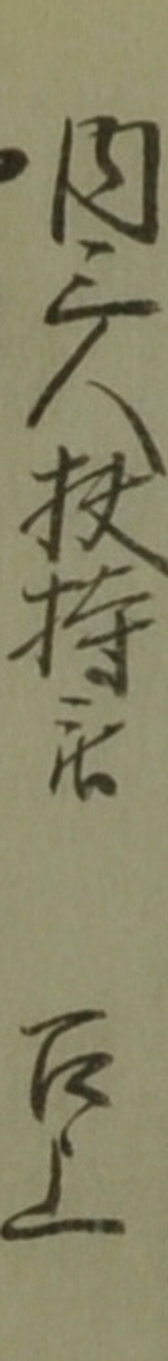内三人扶持被召上
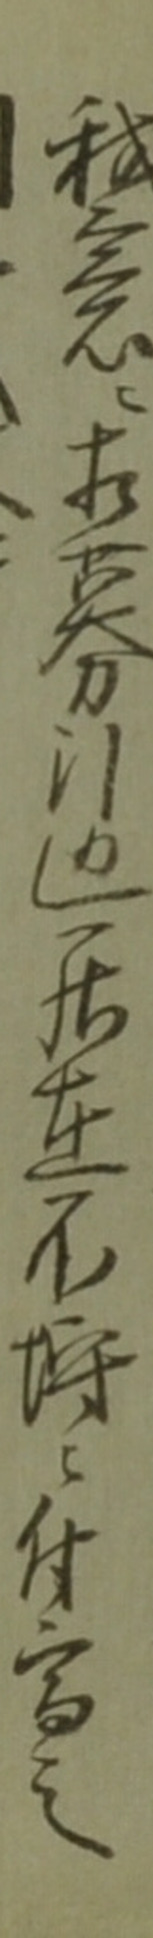我意ニ相募引込罷不埒ニ付富之
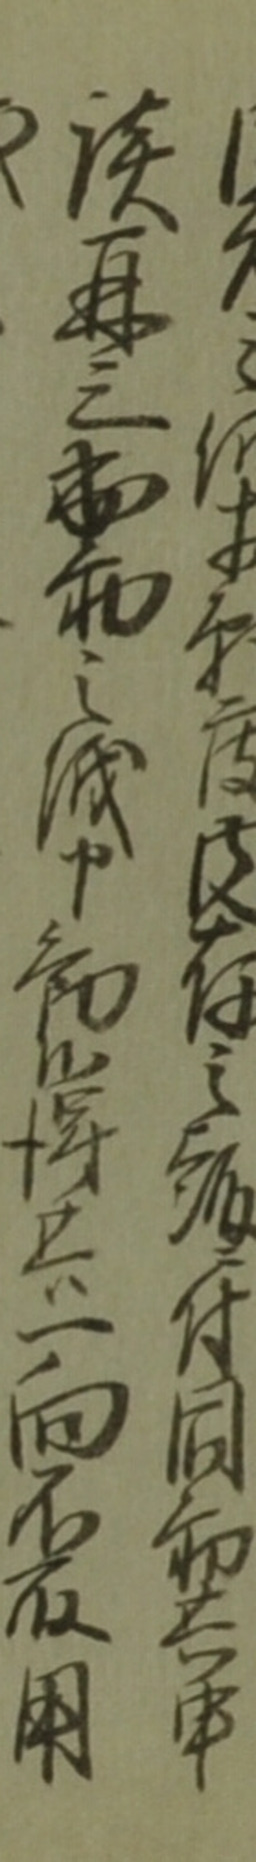談再三出勤之儀申勧候得共一向不取用
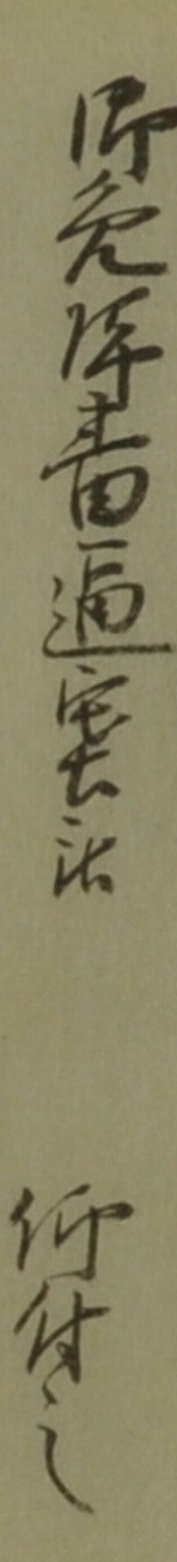御免帰番逼塞被仰付之
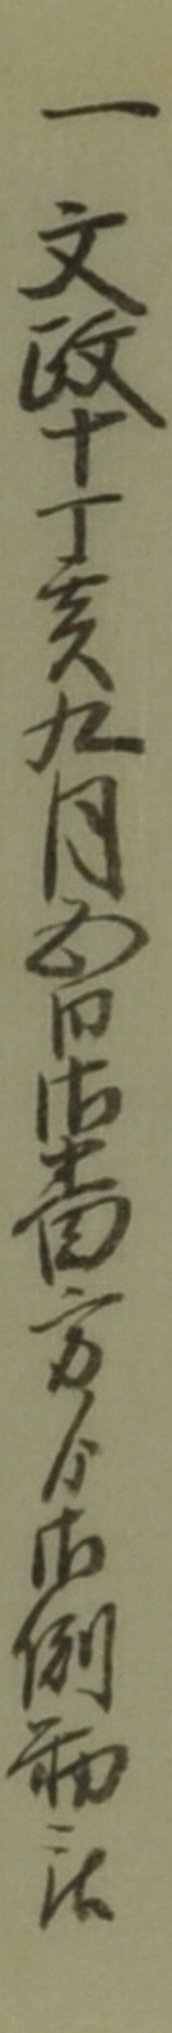一文政十丁亥九月五日御番方ゟ御側勤被
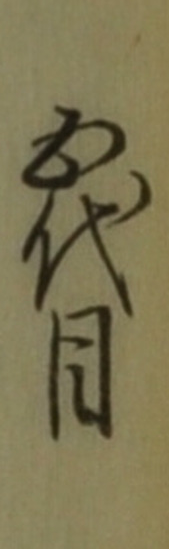五代目
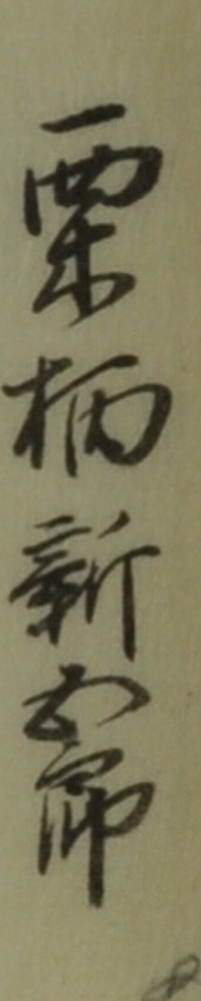栗栖新五郎
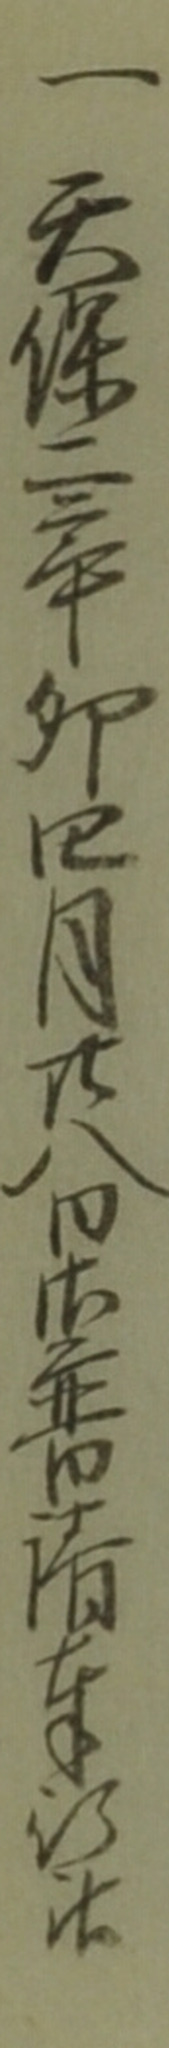一天保二辛卯四月廿八日御普請奉行被
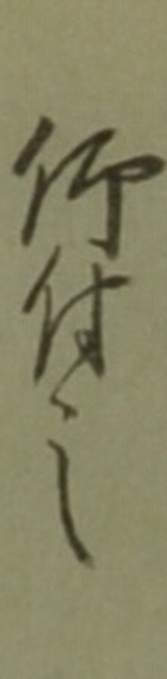仰付之
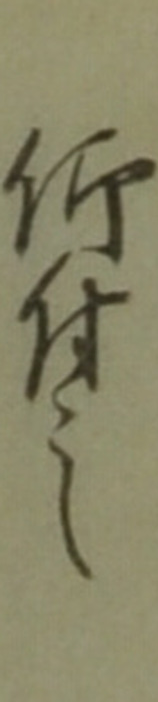仰付之
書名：諸御役代々録（五）
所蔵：伊那市立高遠町図書館・合同会社AMANE
